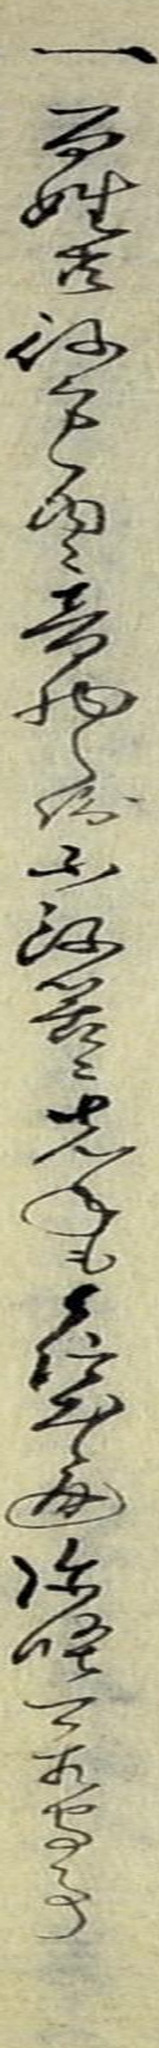一百姓共役方へ内々音物之儀不致筈に先年も被仰出候通弥堅可相守事
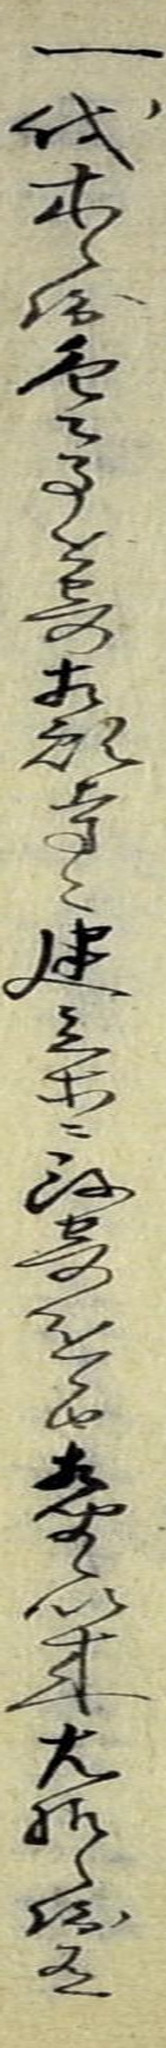一伐木之儀色々事を寄相願寺々建立等に致寄進候由相聞候以来左様之儀有
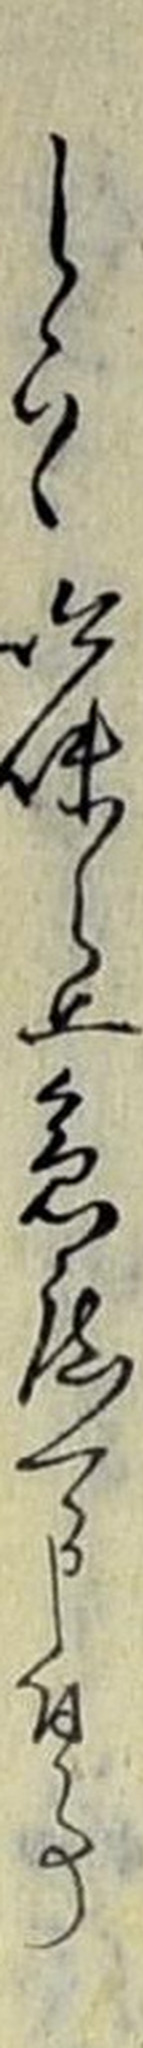之候はゝ吟味之上急度可申付事
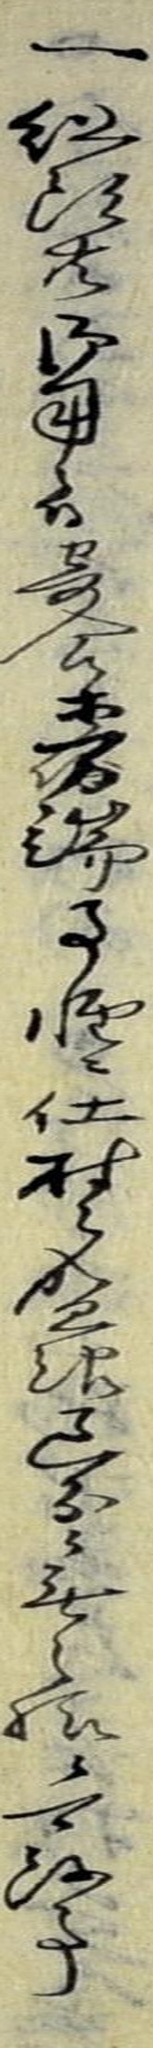一組頭共御用に付寄合等万端事軽に仕村之盛銀過分に無之様に可致事
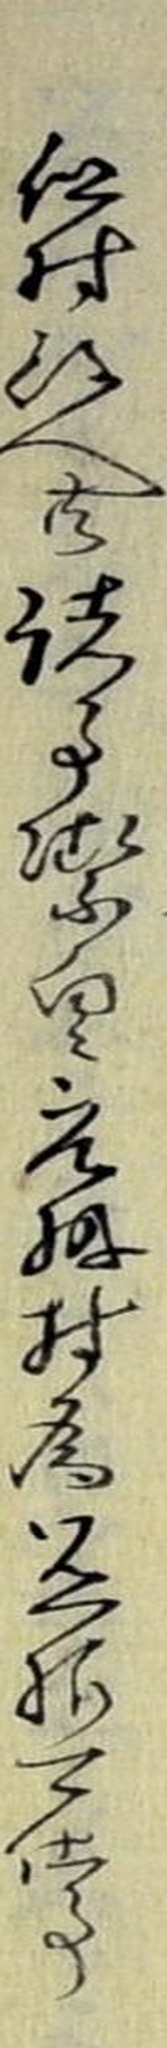但村役人共諸事潔白に取扱村為宜様可仕事
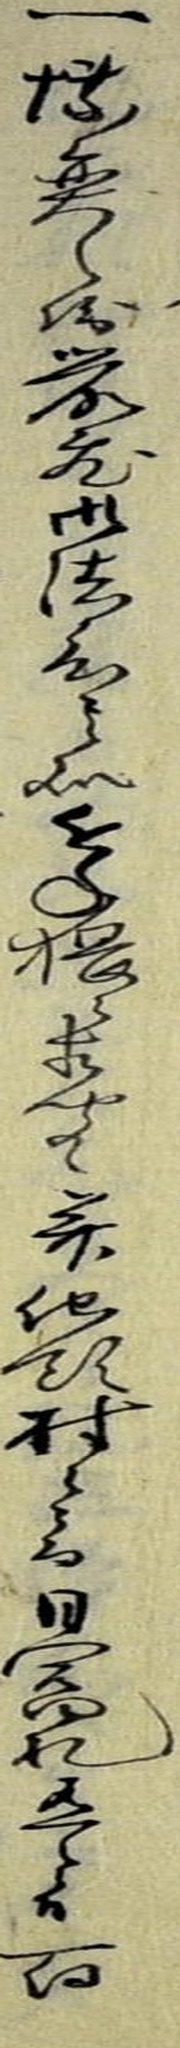一博奕之儀厳敷御法度之処近年猥に相聞候并他領村々に而日富札有之に付百
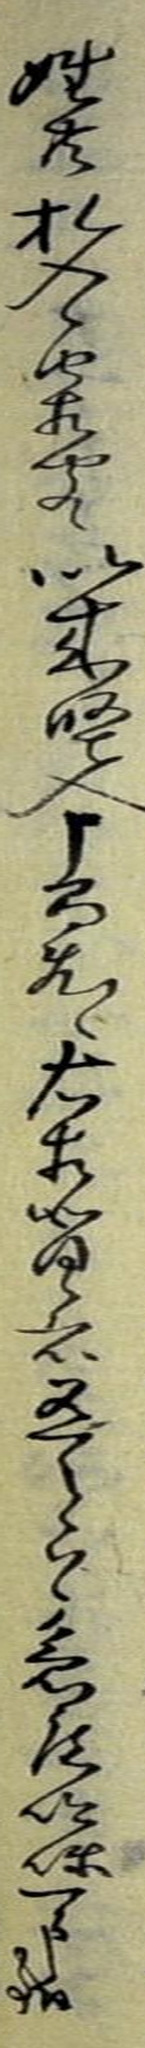姓共札入候由相聞候以来堅入申間敷候右相背候者有之候はゝ急度吟味可申付事
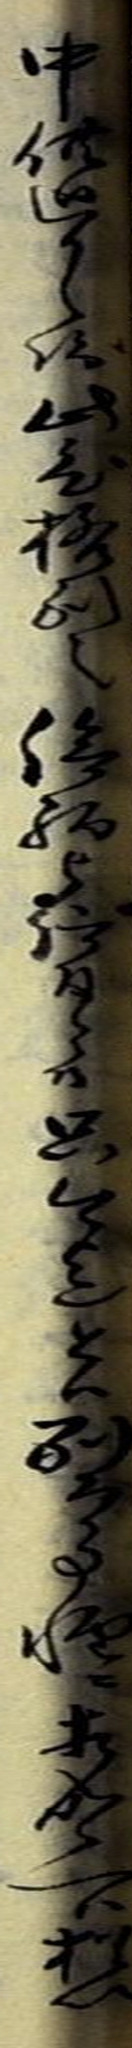中供廻り之儀此度格別之倹約被仰付候に付只今迄とは別而事軽に相成候へは猶以
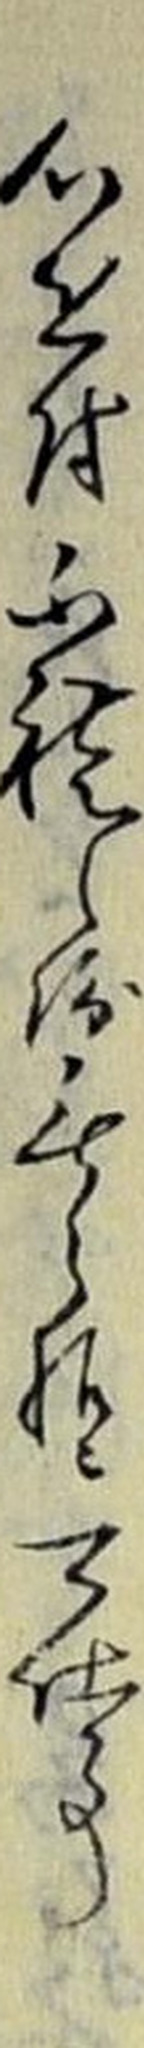心を付不礼之儀無之様に可仕事
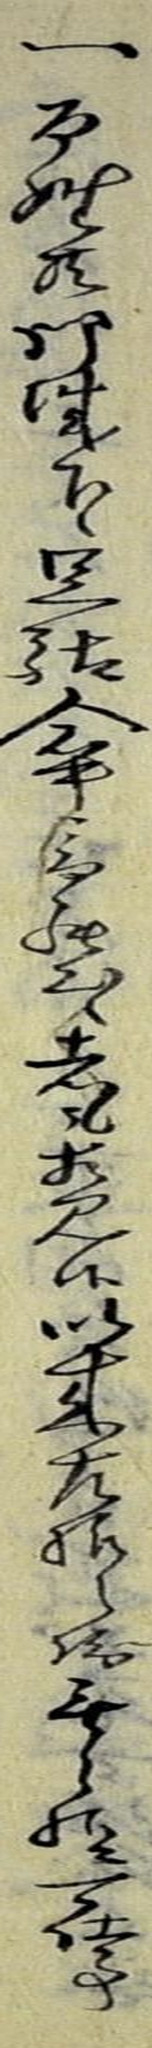一百姓共御城下へ足駄傘に而罷出候者も相見候以来左様之儀無之様に可仕事
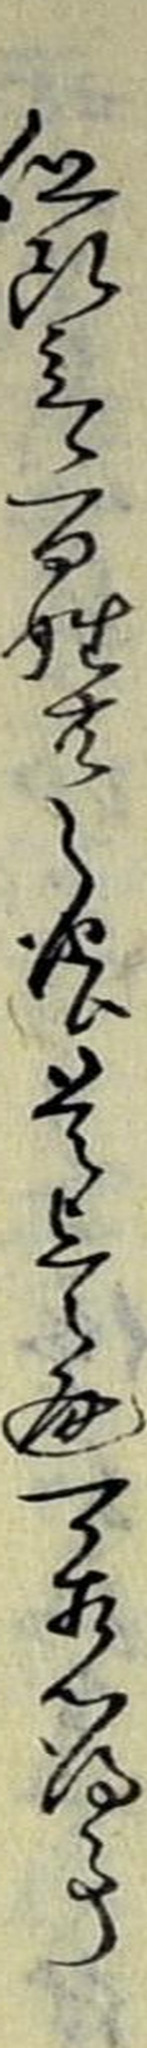但頭立候百姓共之儀は是迄之通可相心得事
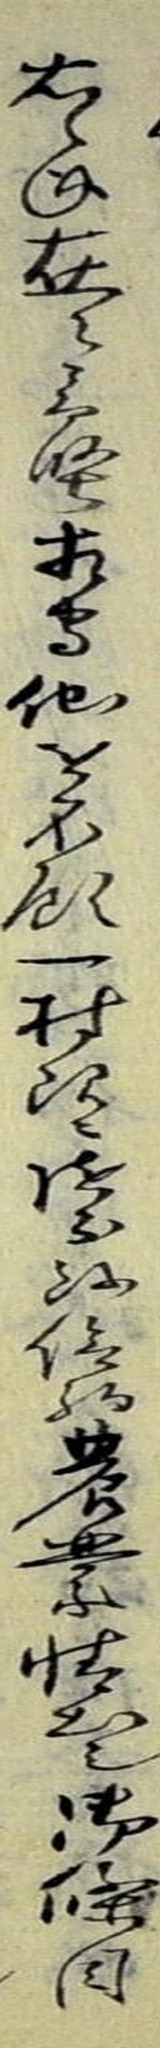右之趣在々に而堅相守他を不顧一村限に随分致倹約農業情し御条目
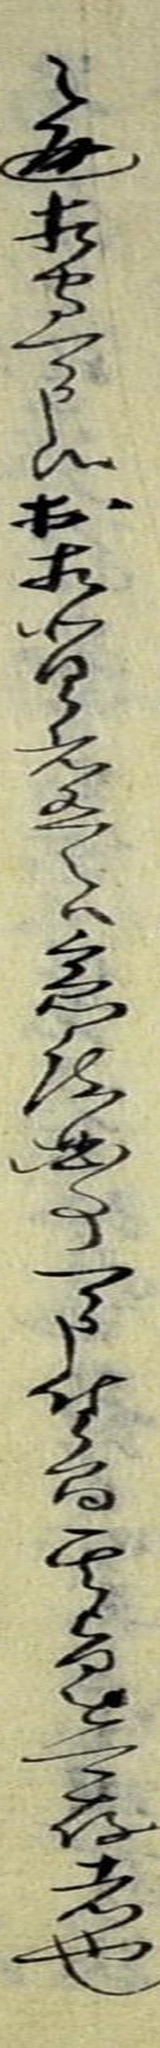之通相守可申候於相背候者有之は急度曲事可申付候間其旨を可存者也
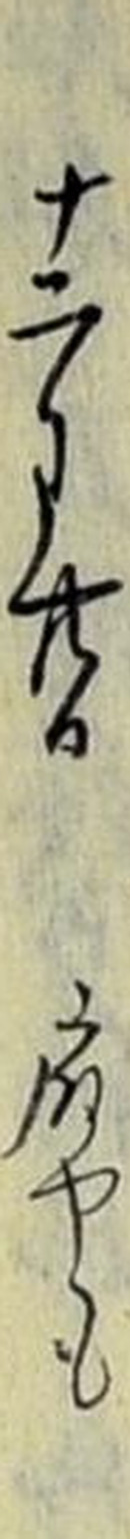十二月廿日府中へも
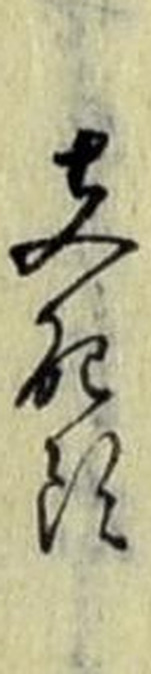支配頭
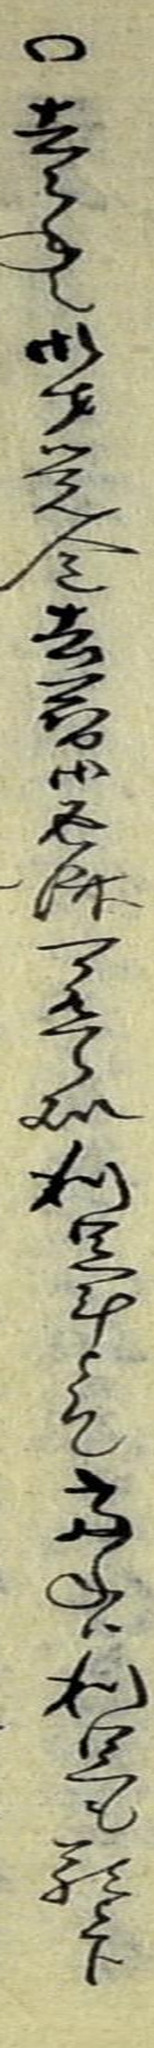〇去々年之御才覚金去暮御返済可有之処利足斗被下候当年は利足も難被下
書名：命令之部 二
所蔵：福井県文書館 Fukui Prefectural Archives
